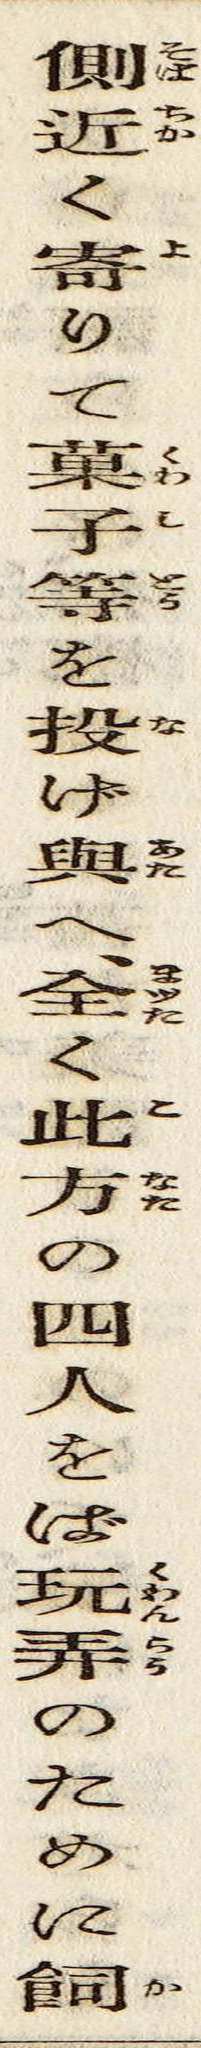側近く寄りて菓子等を投げ与へ、全く此方の四人をば玩弄のために飼
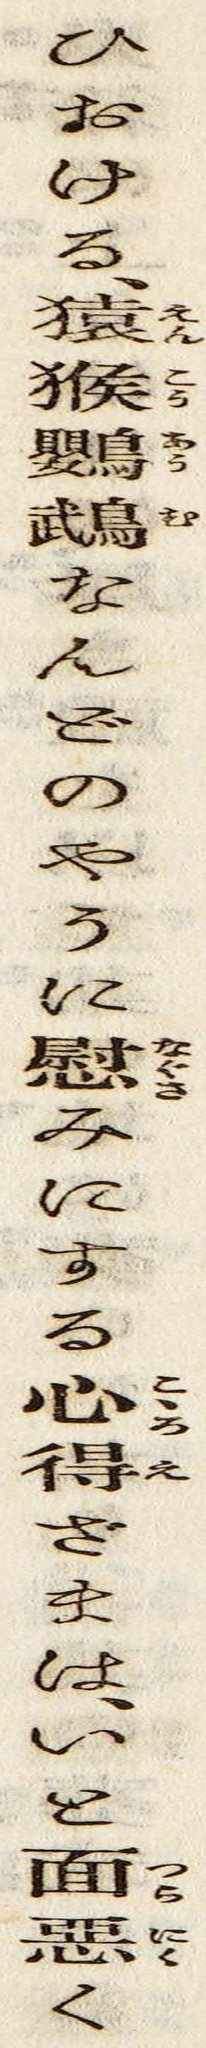ひおける、猿猴鸚鵡なんどのやうに慰みにする心得ざまは、いと面悪く
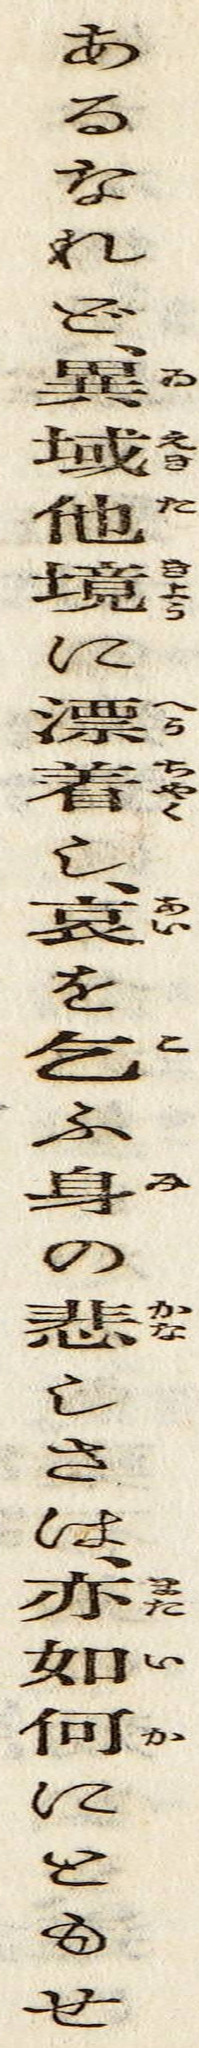あるなれど、異域他境に漂着し、哀を乞ふ身の悲しさは、亦如何にともせ
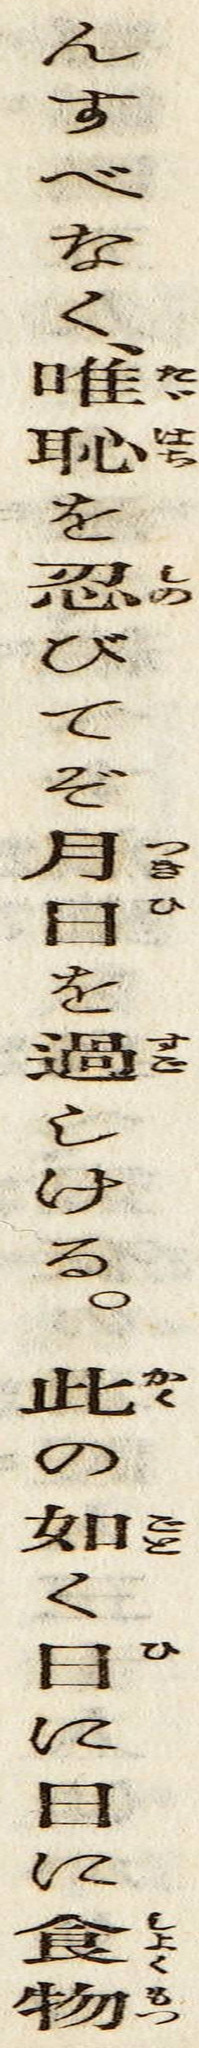んすべなく、唯恥を忍びてぞ月日を過しける。此の如く日に日に食物
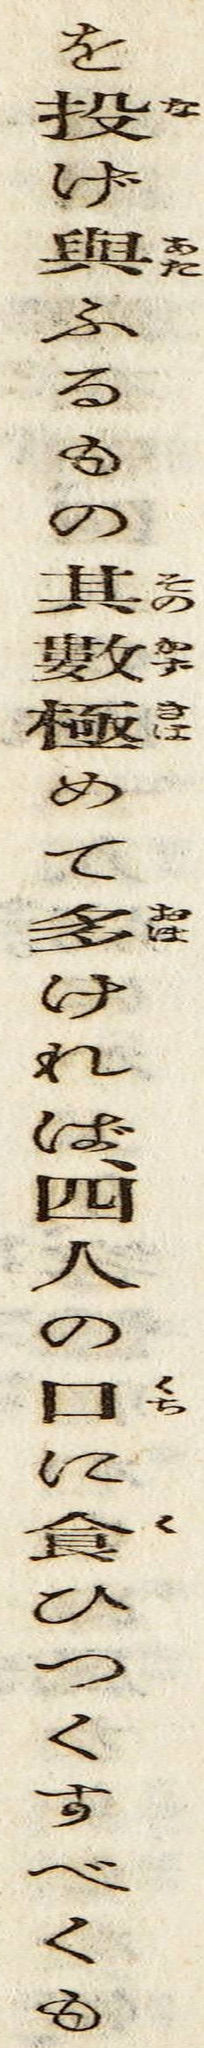を投げ与ふるもの其数極めて多ければ、四人の口に食ひつくすべくも
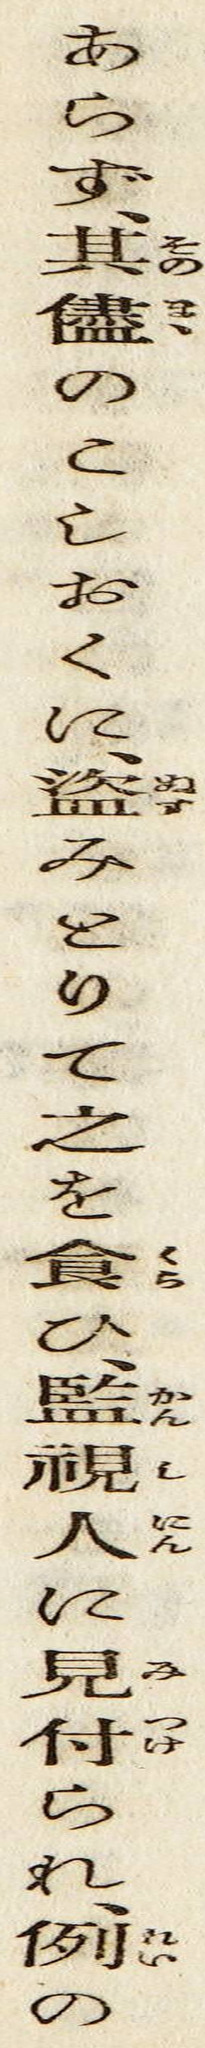あらず、其儘のこしおくに、盗みとりて之を食ひ、監視人に見付られ、例の
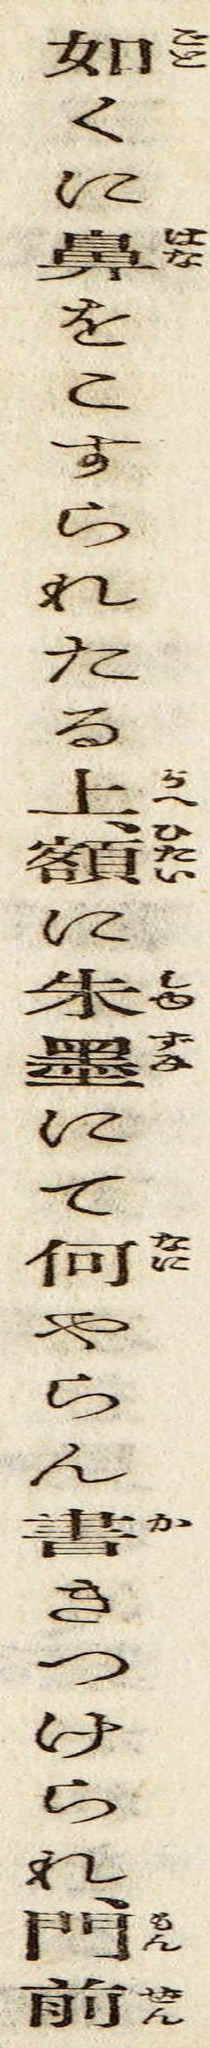如くに鼻をこすれらたる上、額に朱墨にて何やらん書きつけられ、門前

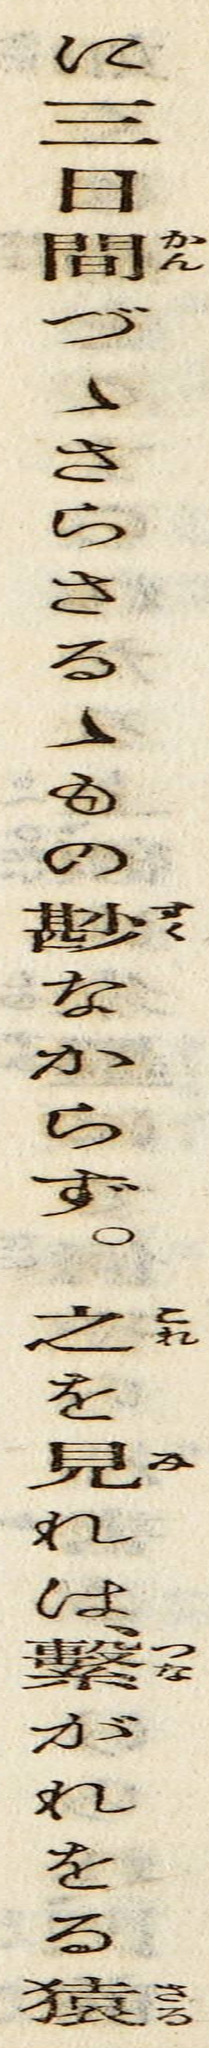に三日間づゝさらさるゝもの尠なからず。之を見れは、繋がれをる猿
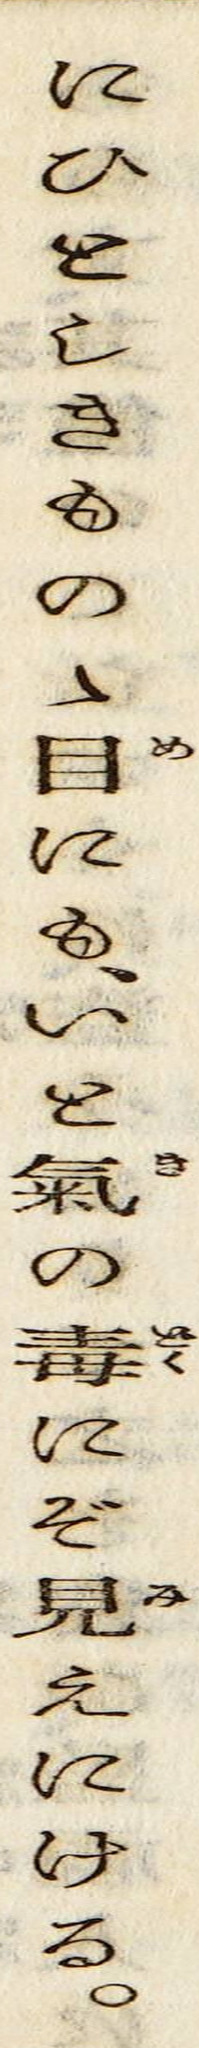にひとしきものゝ目にも、いと気の毒にぞ見えにける。
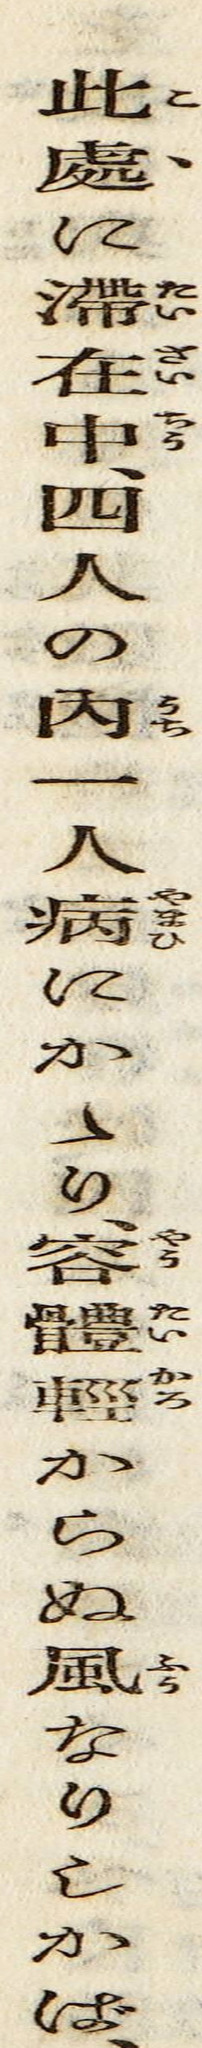此処に滞在中、四人の内一人病にかゝり、容体軽からぬ風なりしかば、
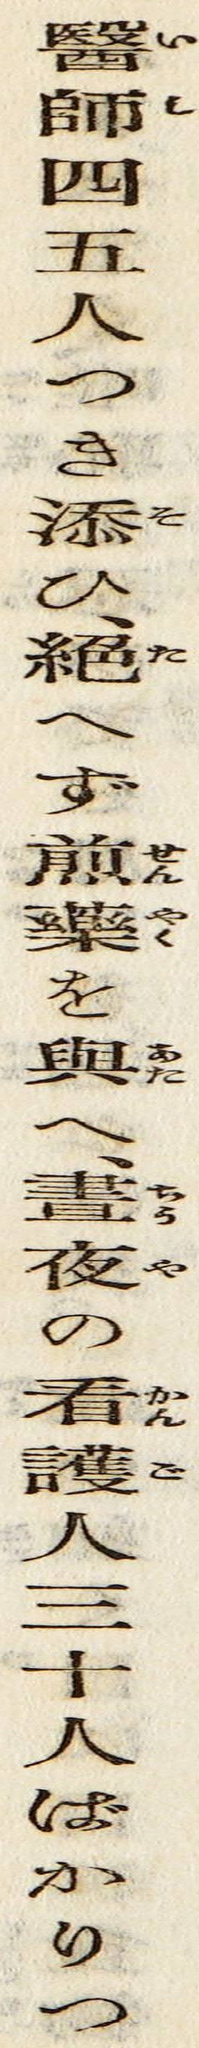医師四五人つき添ひ、絶へず煎薬を与へ、昼夜の看護人三十人ばかりつ
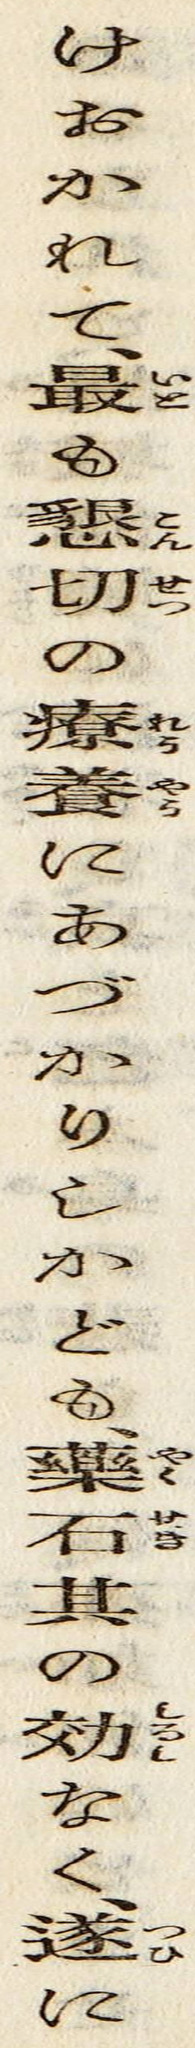けおかれて、最も懇切の療養にあづかりしかども、薬石其の効なく、遂に
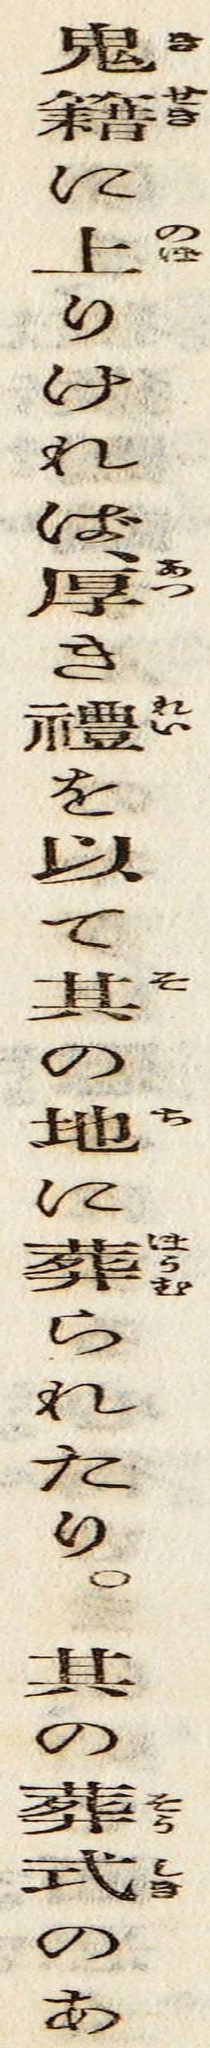鬼籍に上りければ、厚き礼を以て其の地に葬られたり。其の葬式のあ
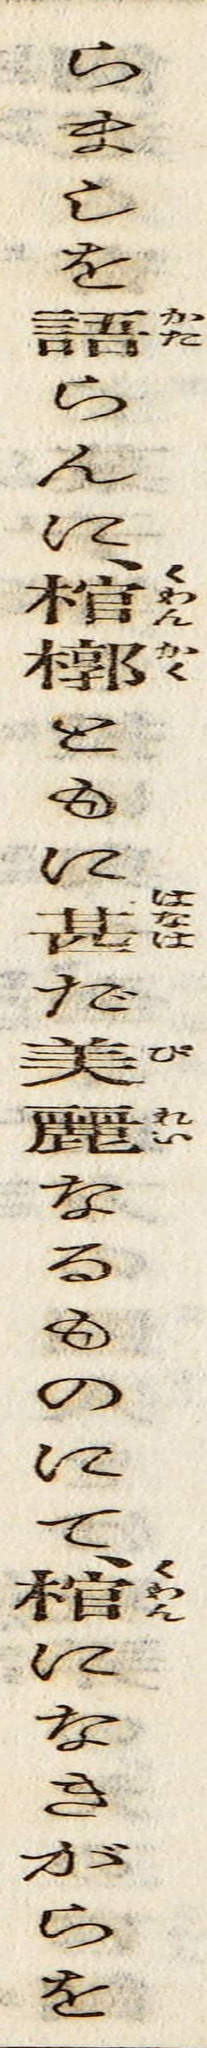らましを語らんに、棺槨ともに甚だ美麗なるものにて、棺になきがらを
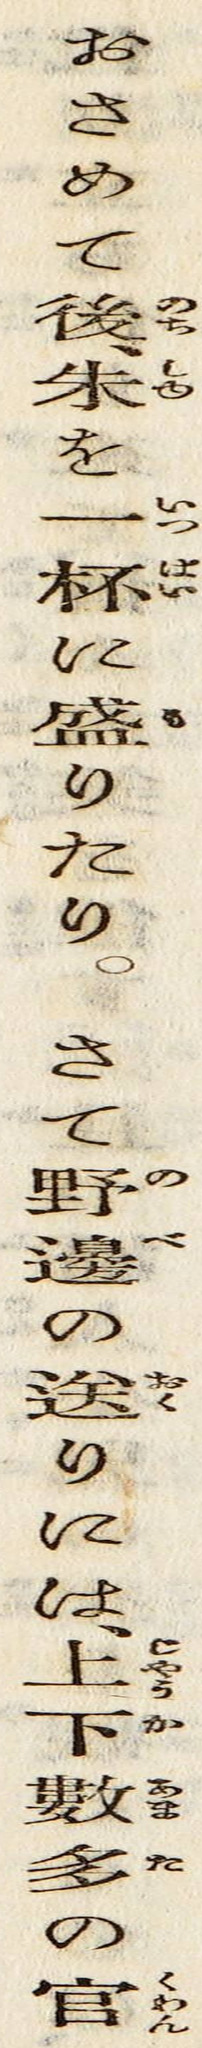おさめて後、朱を一杯に盛りたり。さて野辺の送りには、上下数多の官
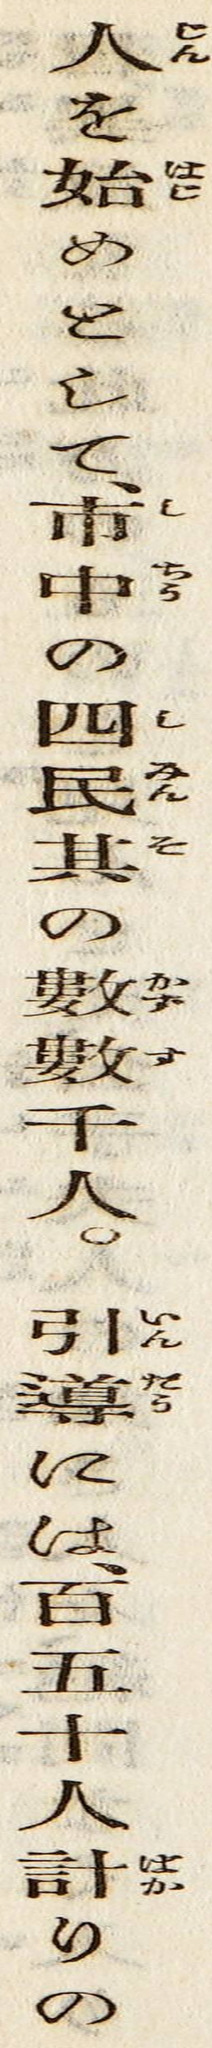人を始めとして、市中の四民其の数数千人。引導には、百五十人計りの
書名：日本漂流譚
